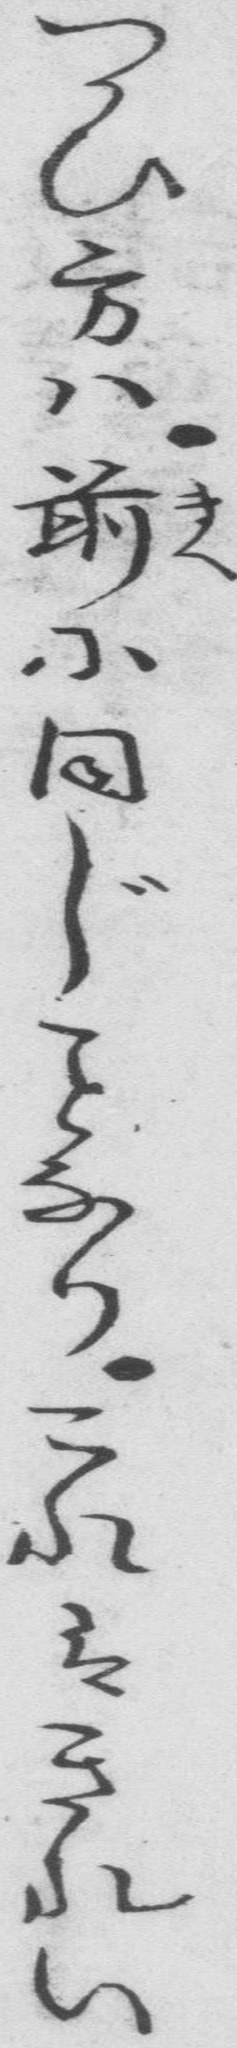つかひ方は。前に同じことなり。これはきれい
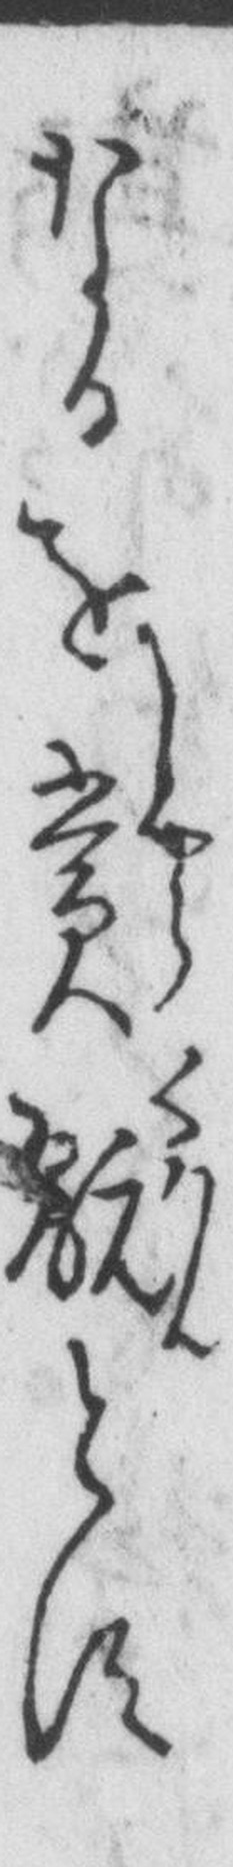なるを賞翫とす
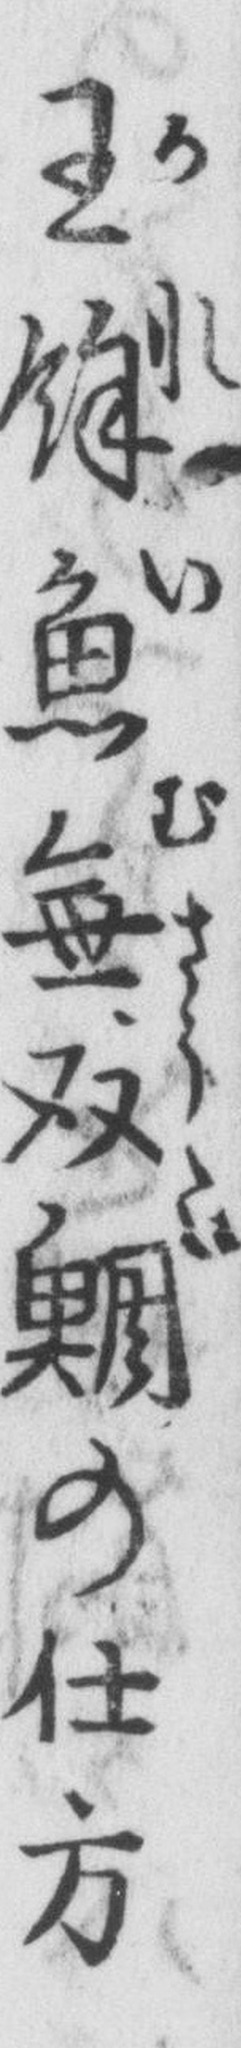王余魚無双鯛の仕方
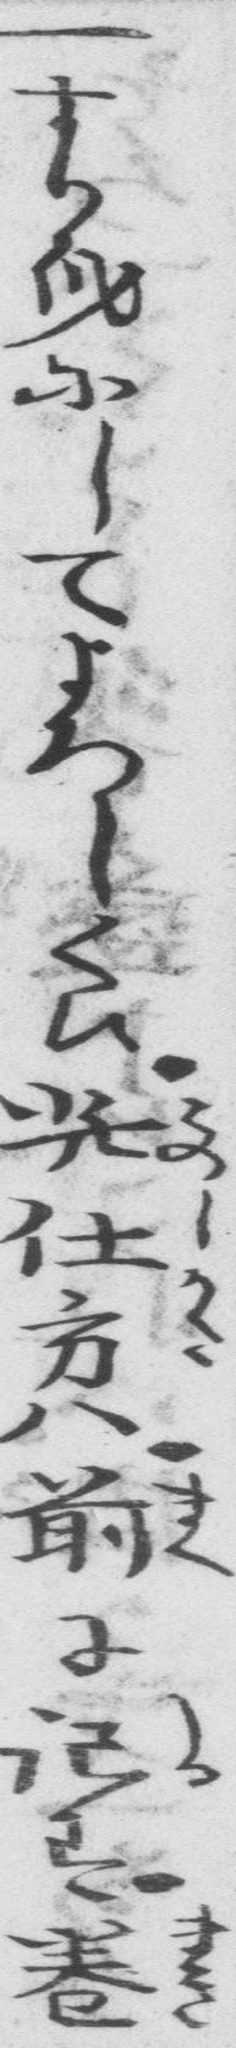一すり身にしてよろしく候。此仕方は。前に記す。巻
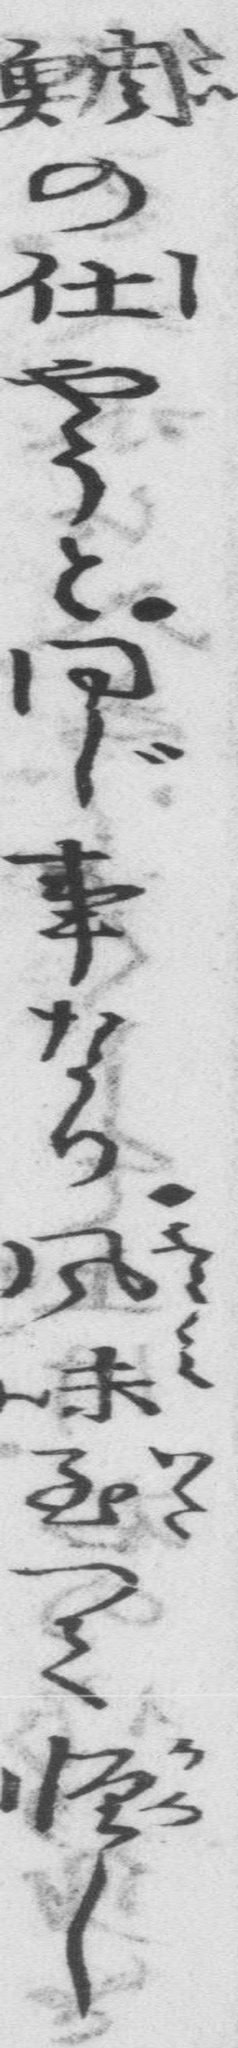鯛の仕やうと。同じ事なり。風味至つて軽し
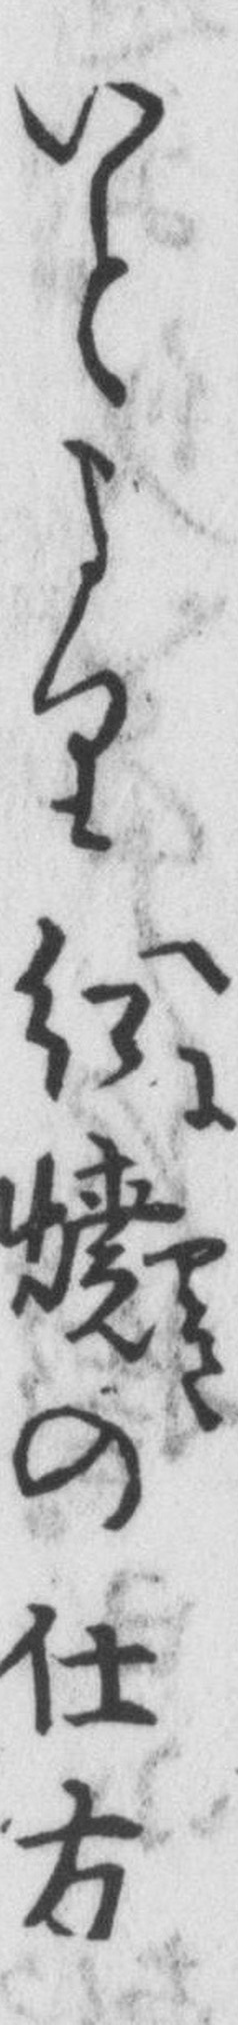いとより紅焼の仕方
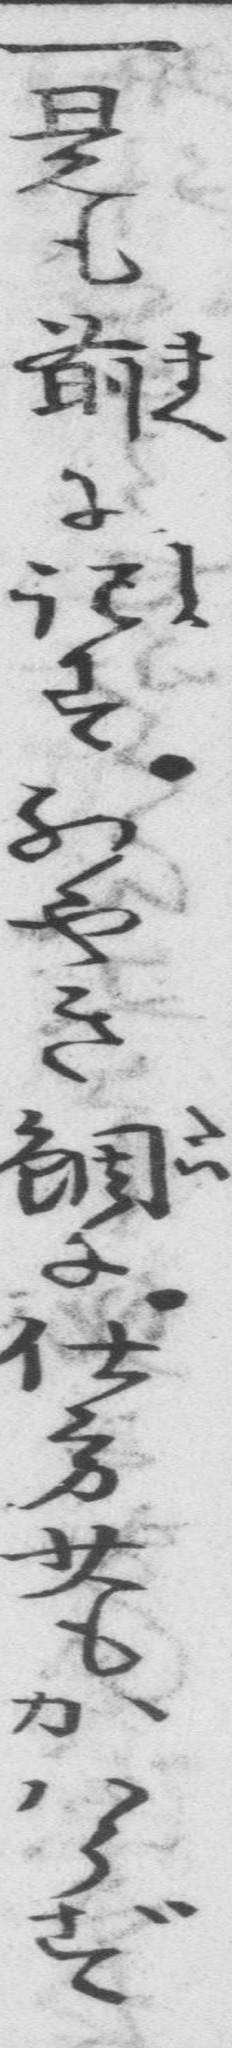一是も前に記す。紅やき鯛に。仕方少もかはらず
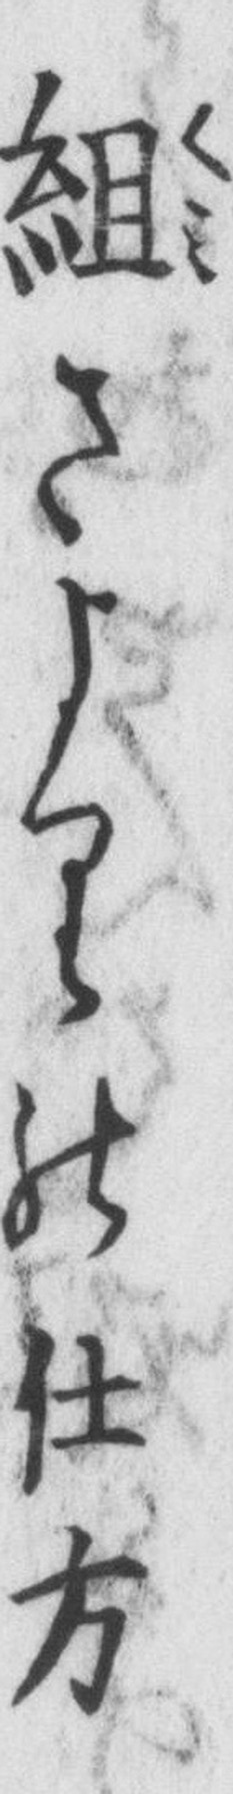組さよりの仕方
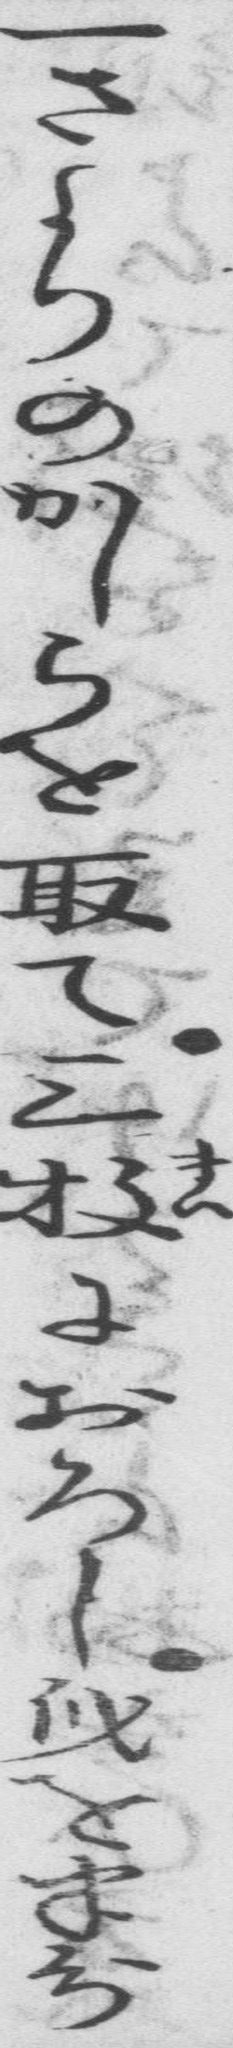一さよりのかしらを取て。三枚におろし。身を半分
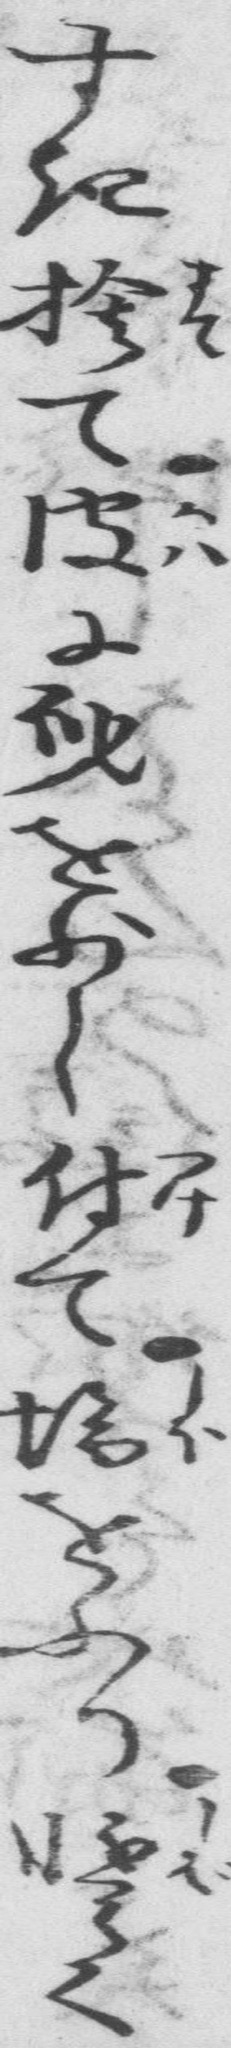すき捨て。皮に身を少し付て。塩をふり。暫らく
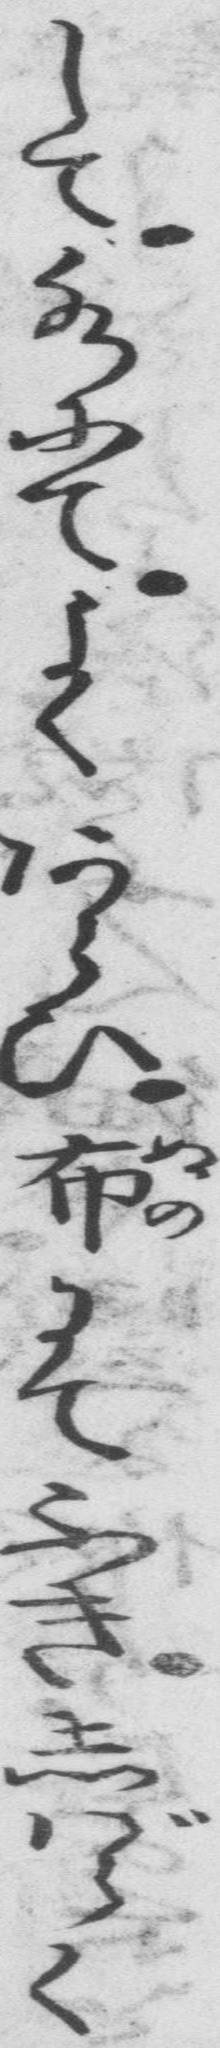して。水にて。よくあらひ。布にてふき。しばらく

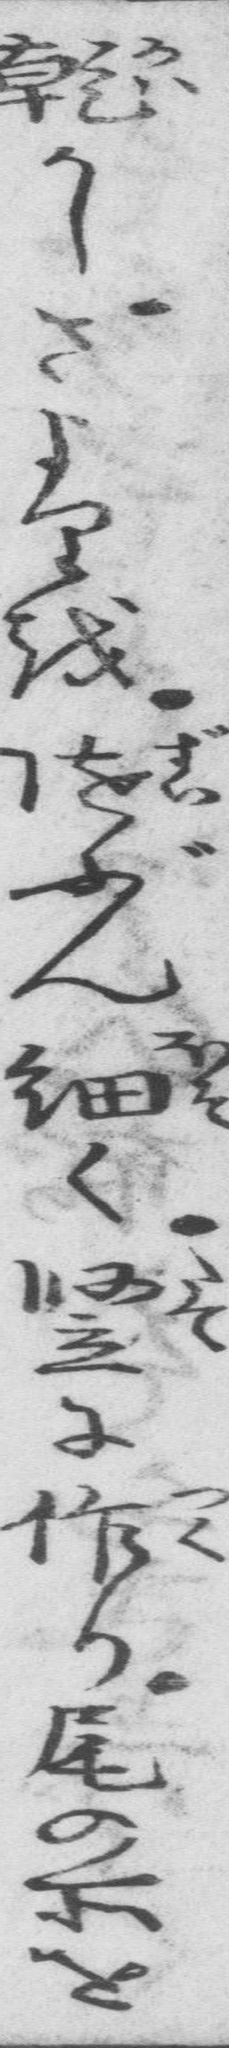乾かし。さよりを。随ぶん細く。竪に作り。尾の所を
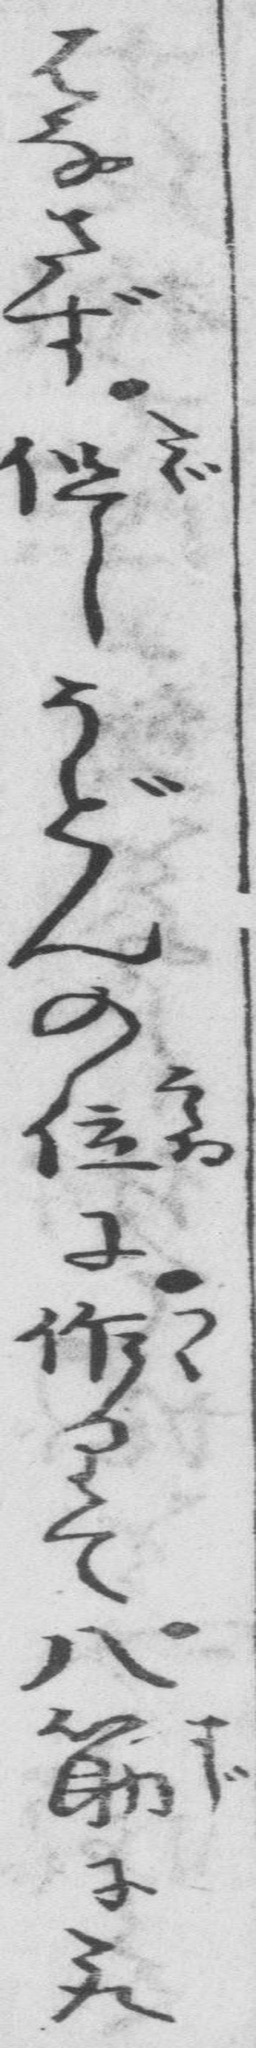はなさず。但しうどんの位に。作りて。八筋に取
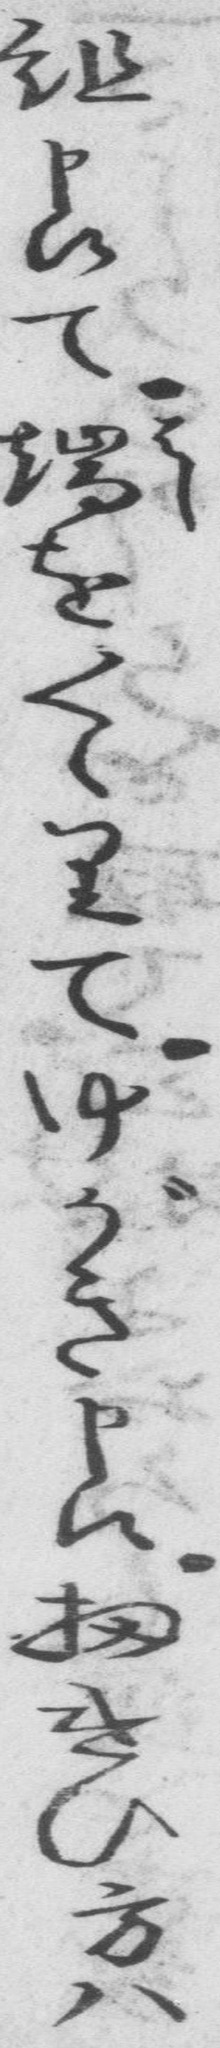組申候て。端をくゝりて。ゆがき申候。扨遣ひ方は
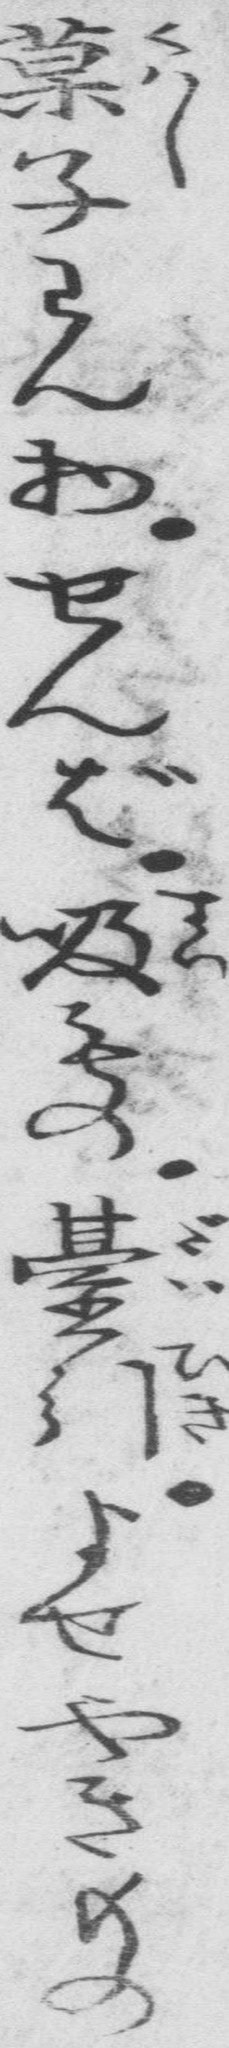菓子わん物。せんば。吸もの。台引。よせやきもの
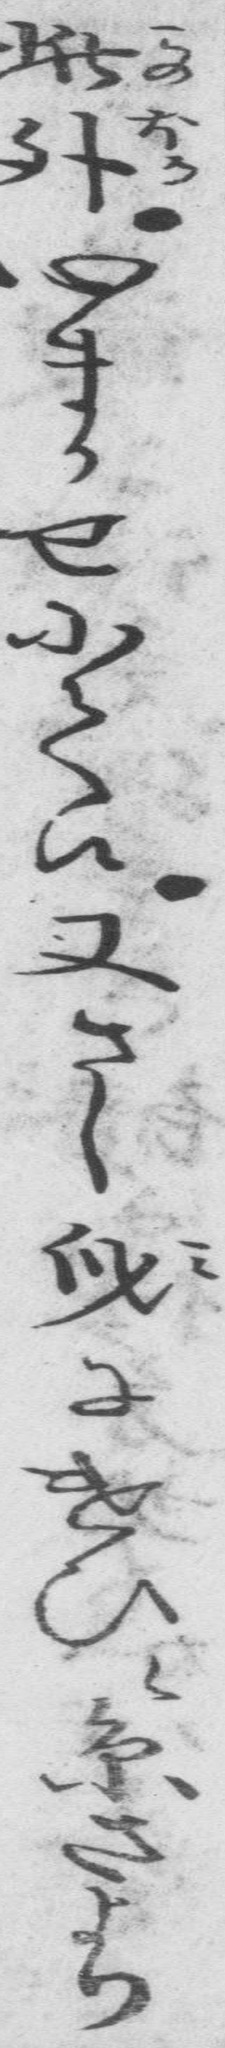此外。心まかせにて候。又さし身に遣ひに糸さより
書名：萬寳料理秘密箱
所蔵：大阪府立大学学術情報センター 国文学研究資料館
